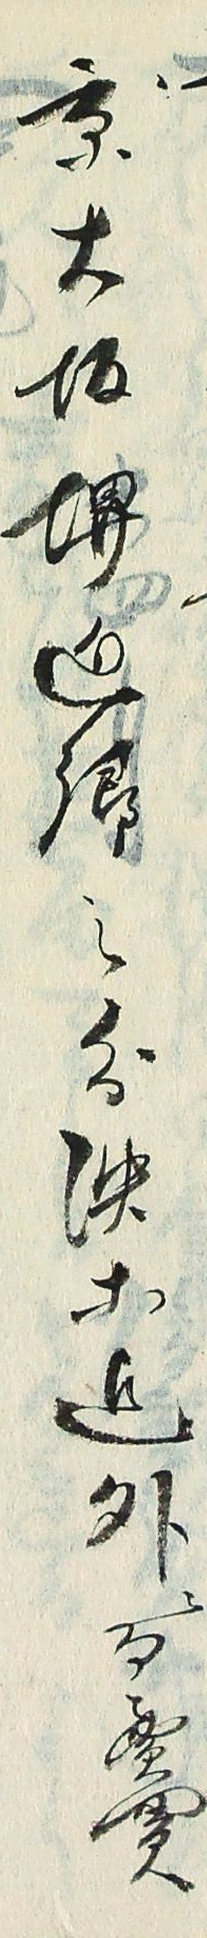京大坂堺近郷之分潰等迄外に而売買
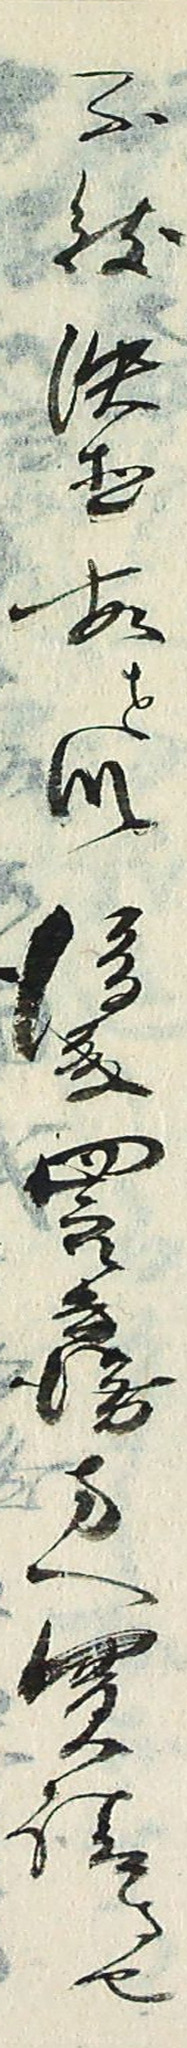不致潰直段を以後藤四郎兵衛方へ買請させ
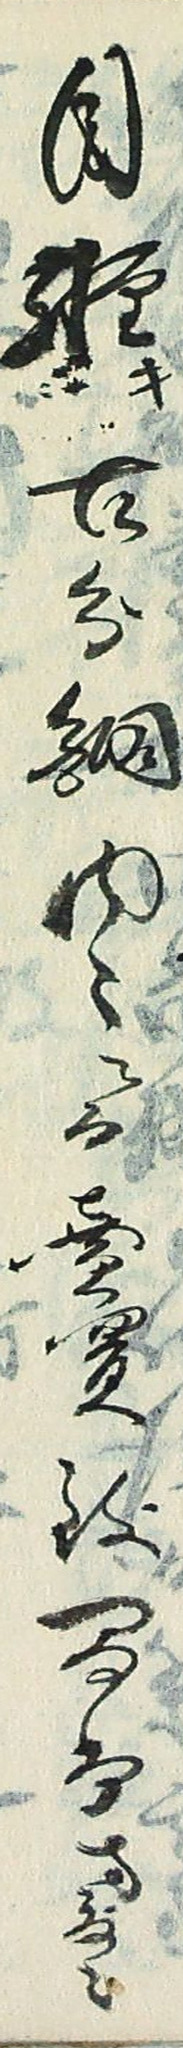目軽き古分銅内々に而売買致間布方度々
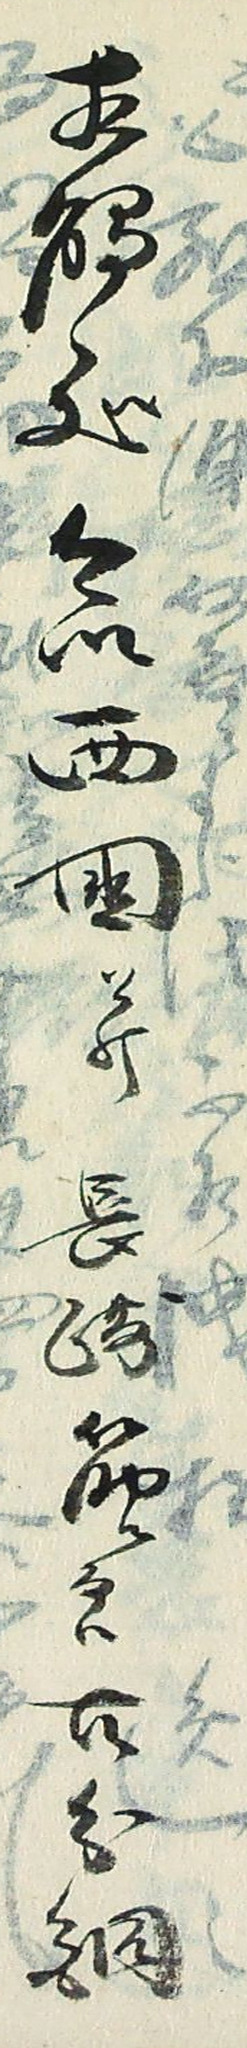相触候処今以西国幷長崎筋に而は古分銅
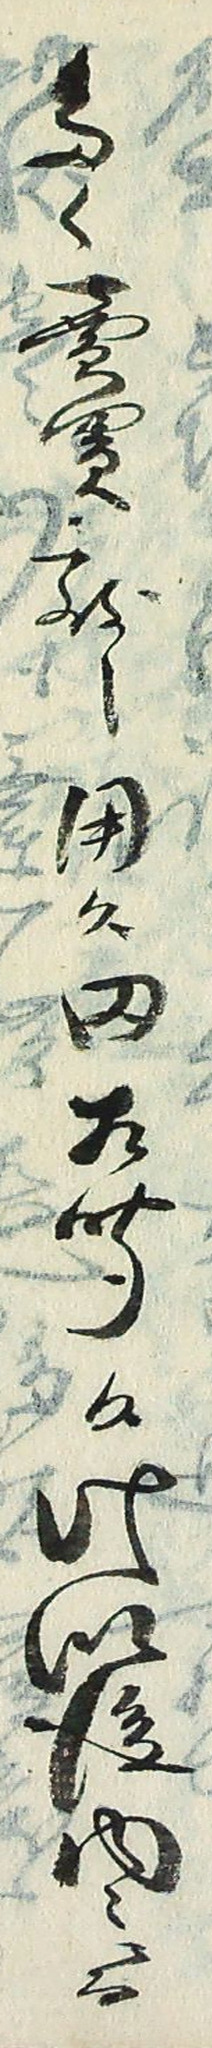多く売買致し用候由相聞候此以後内々に而
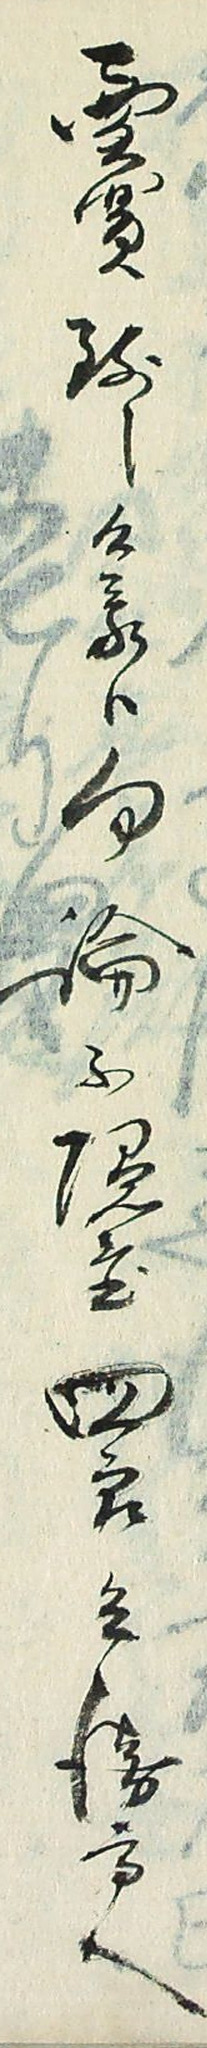売買致し候義は勿論不隠置四郎兵衛方へ
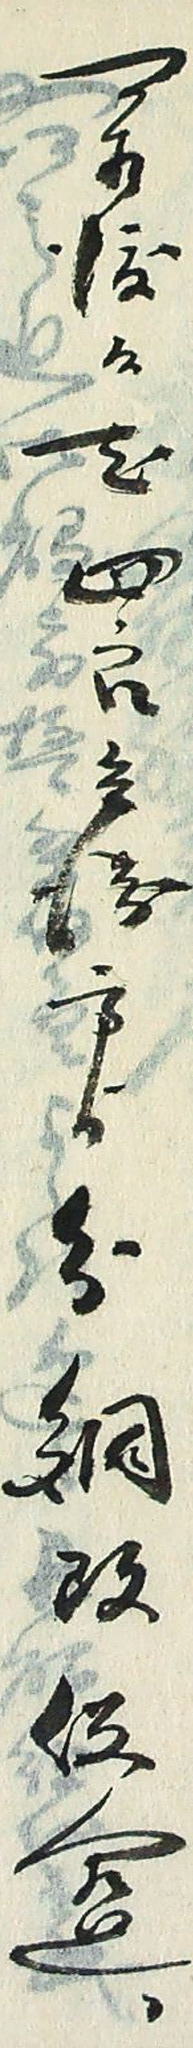可相渡候尤四郎兵衛方ゟ分銅改役人相廻り
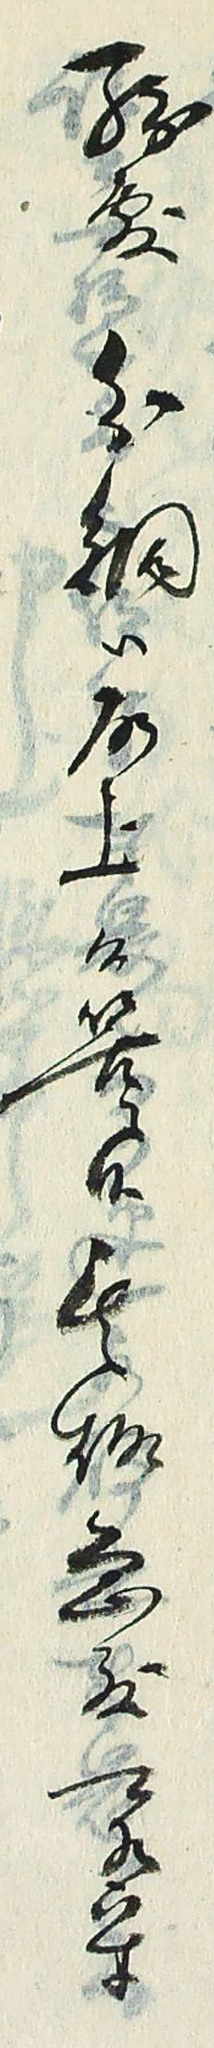紛敷分銅は取上候筈に候其趣急度可相守
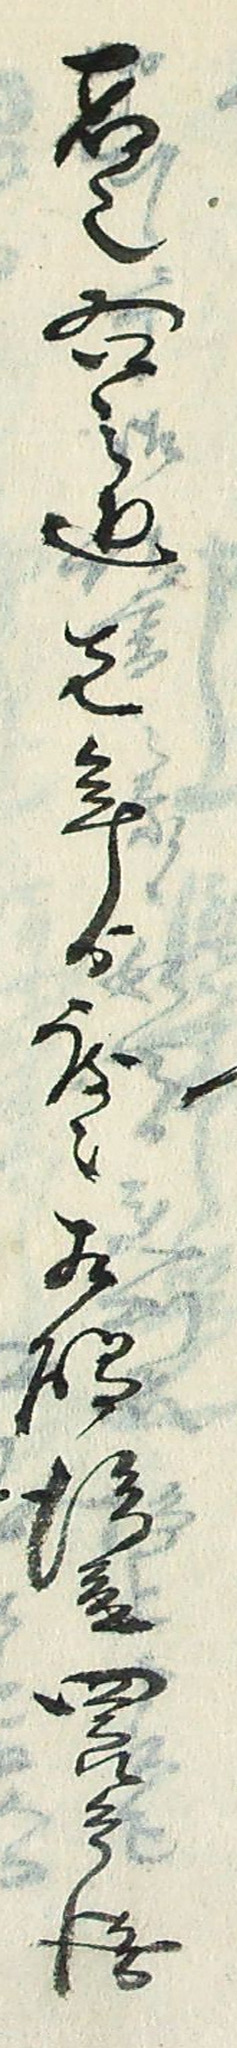者也右之通先年より度々相触後藤四郎兵衛
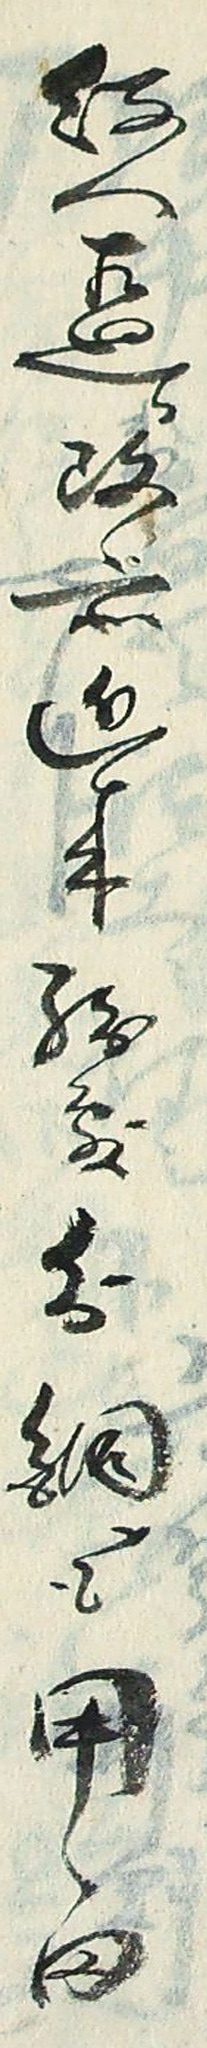役人相廻り改候所近来紛敷分銅をも用候由

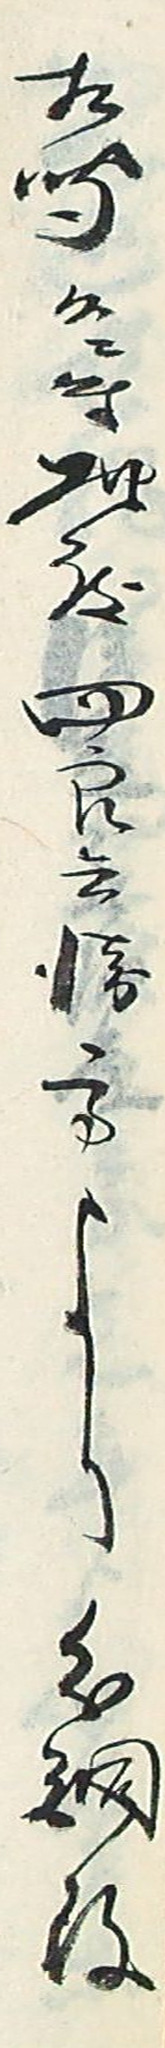相聞候に付此度四郎兵衛方より分銅改
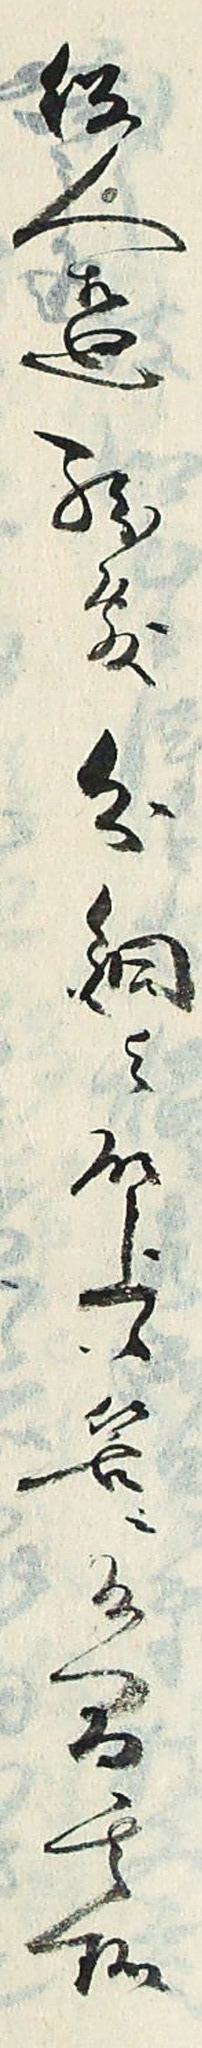役人相廻紛敷分銅は取上候筈に候間其趣
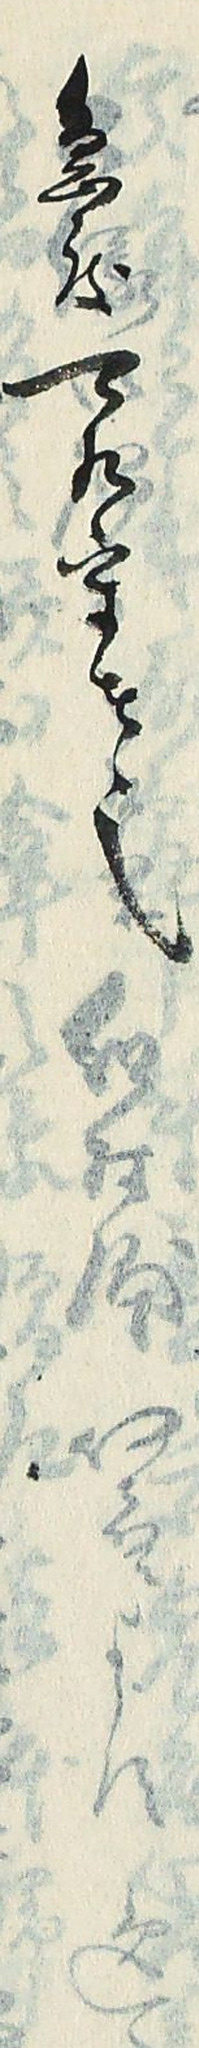急度可相守者也
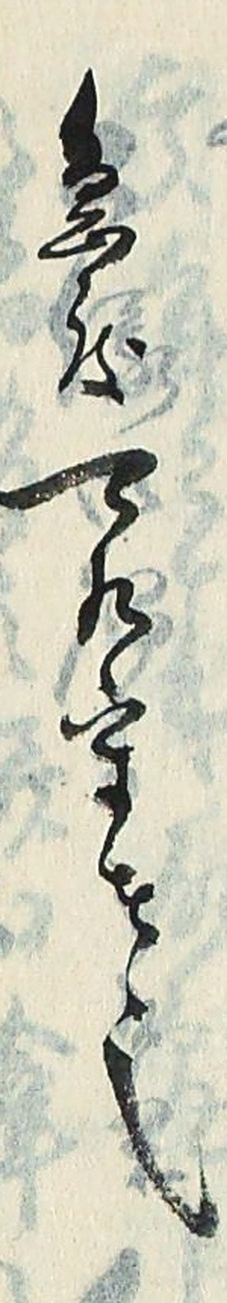急度可相守者也
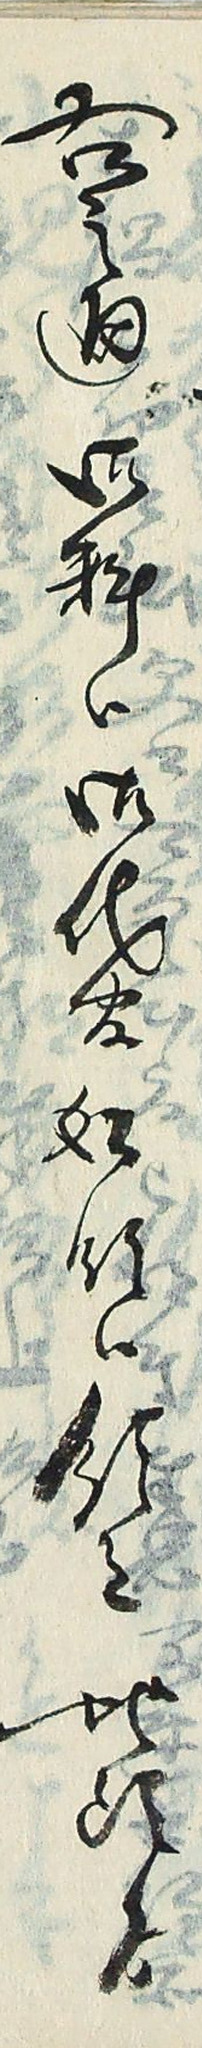右之通御料は御代官私領は領主地頭ゟ
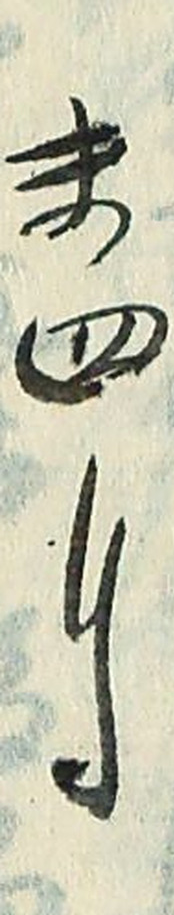未四月
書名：諸御用御□受書控
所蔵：鳴門教育大学 Naruto University of Education
